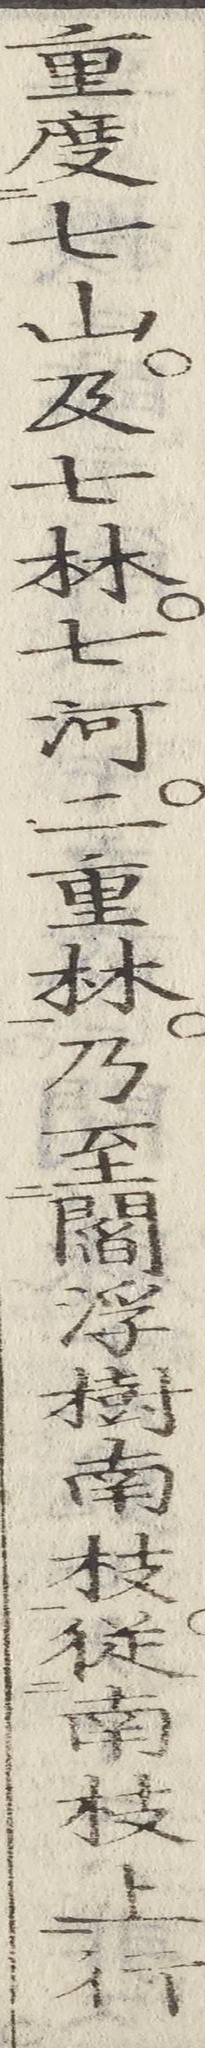重度ニ七山。及七林。七河。二重林。乃至ニ閻浮樹南枝。従ニ南枝上。行
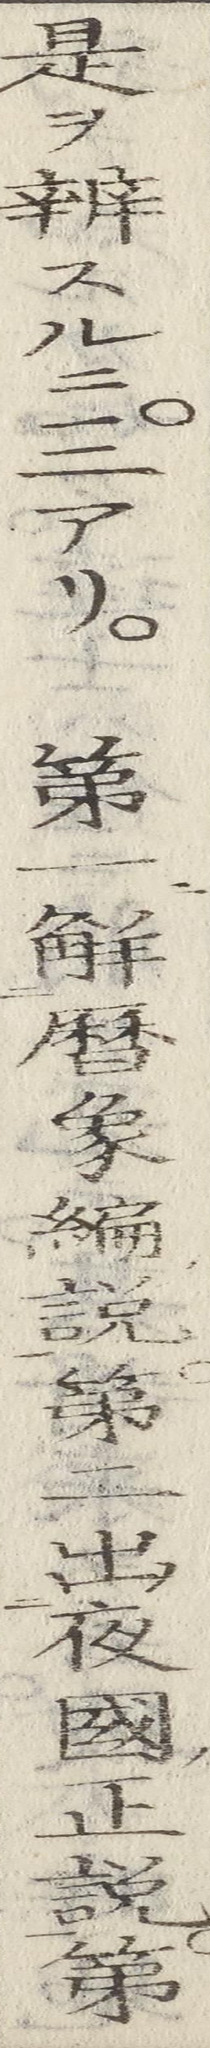是ヲ弁スルニ。三アリ。第一觧ニ暦象編説。第ニ出ニ夜国正説。第
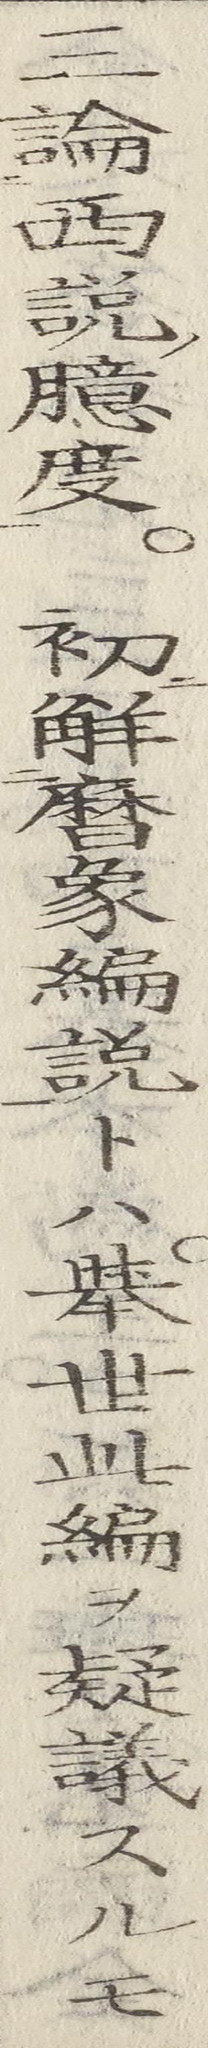三論ニ西説臆度。初觧ニ暦象編説トハ。挙世此編ヲ疑議スルモ
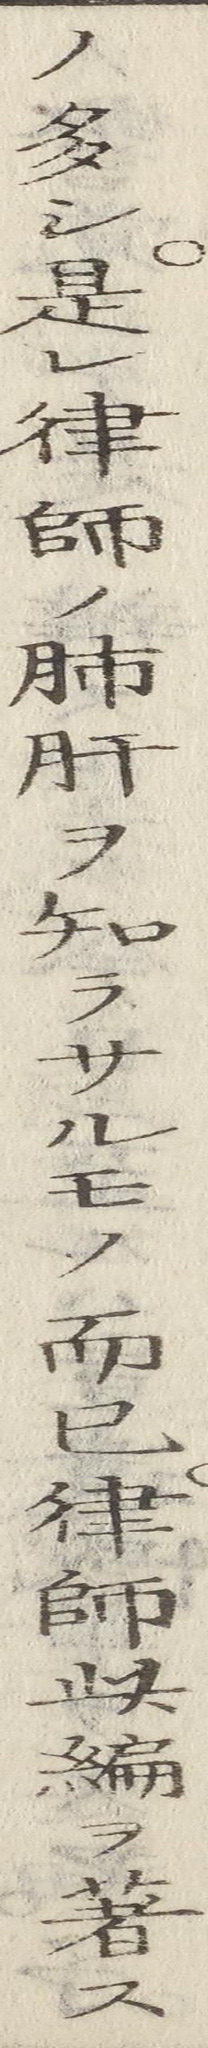ノ多シ。是レ律師ノ肺肝ヲ知ラサルモノ而已。律師此編ヲ著ス
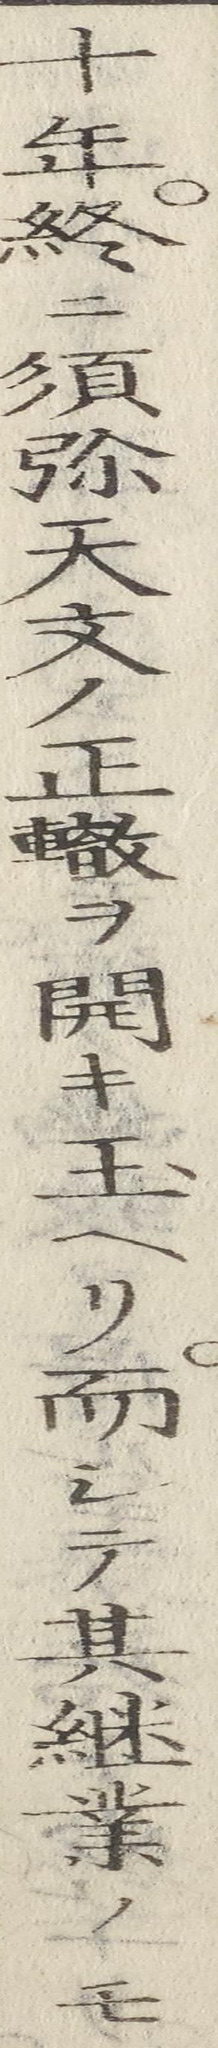十年。終ニ須弥天文ノ正轍ヲ開キ玉ヘリ。而シテ其継業ノモ

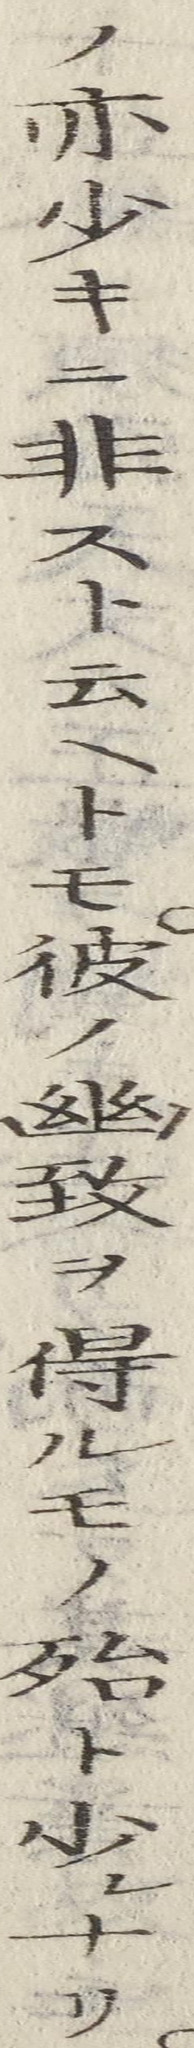ノ亦少キニ非スト云ヘトモ。彼ノ幽致ヲ得ルモノ殆ト少シナリ。
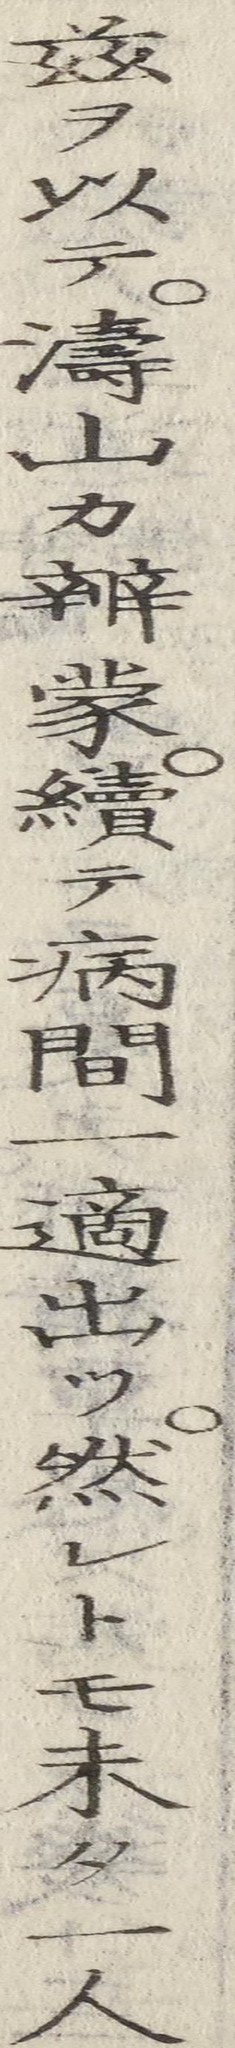玆ヲ以テ。涛山カ弁蒙。続テ病間一適出ツ。然レトモ未タ一人
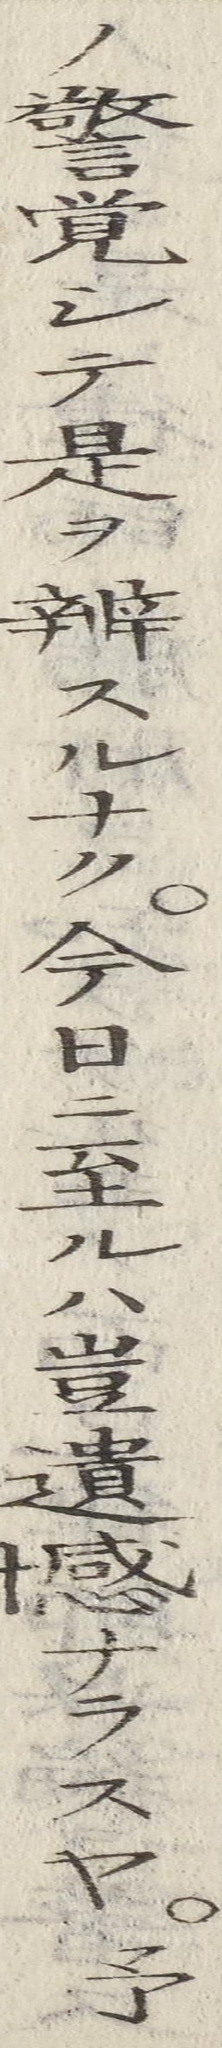ノ警覚シテ是ヲ弁スルナク。今日ニ至ルハ豈遺憾ナラスヤ。予
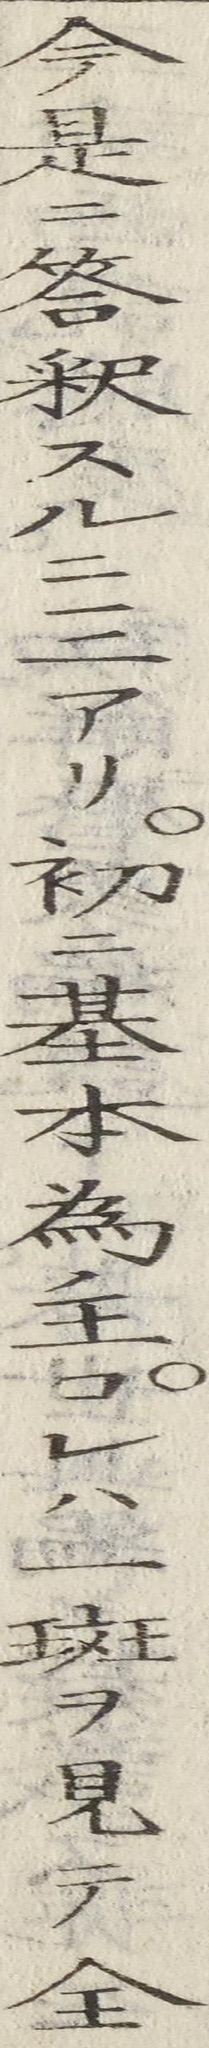今是ニ答釈スルニ三アリ。初ニ基本為主。コレハ一斑ヲ見テ全
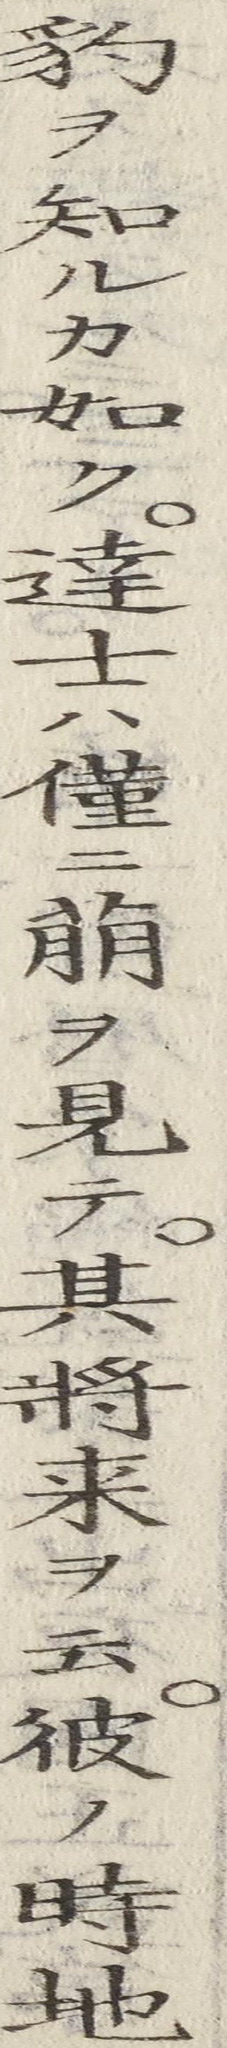豹ヲ知ルカ如ク。達士ハ僅ニ萌ヲ見テ。其将来ヲ云。彼ノ時地
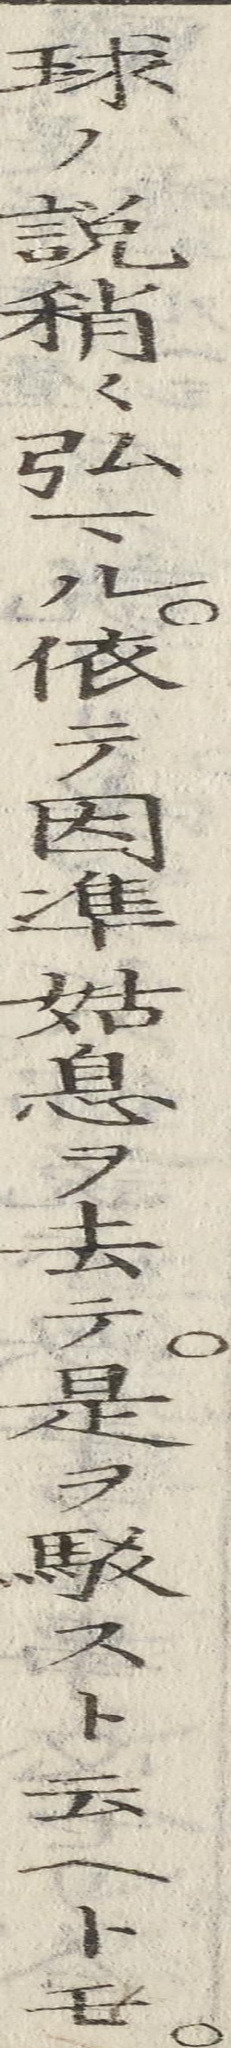球ノ説稍〱弘マル。依テ因準姑息ヲ去テ。是ヲ駁スト云ヘトモ。
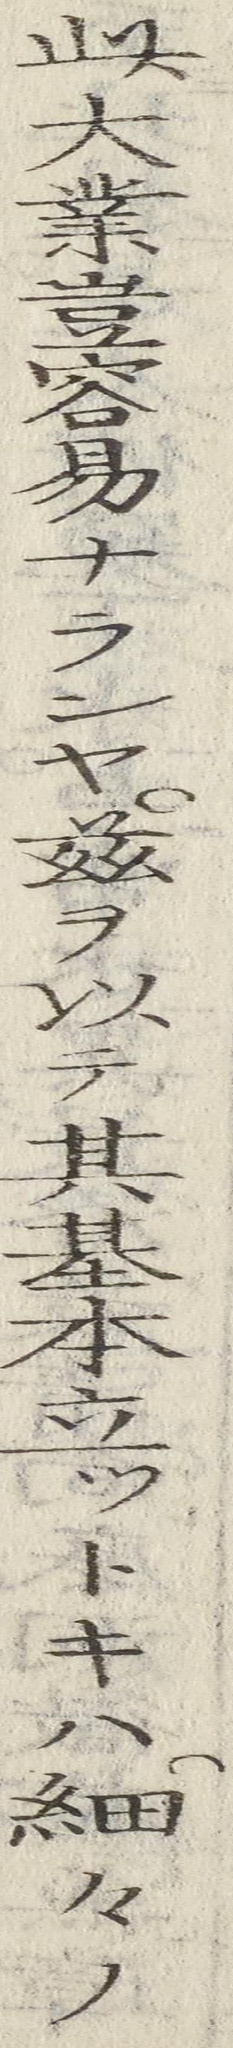此大業豈容易ナランヤ。玆ヲ以テ其基本立ツトキハ。細々ノ
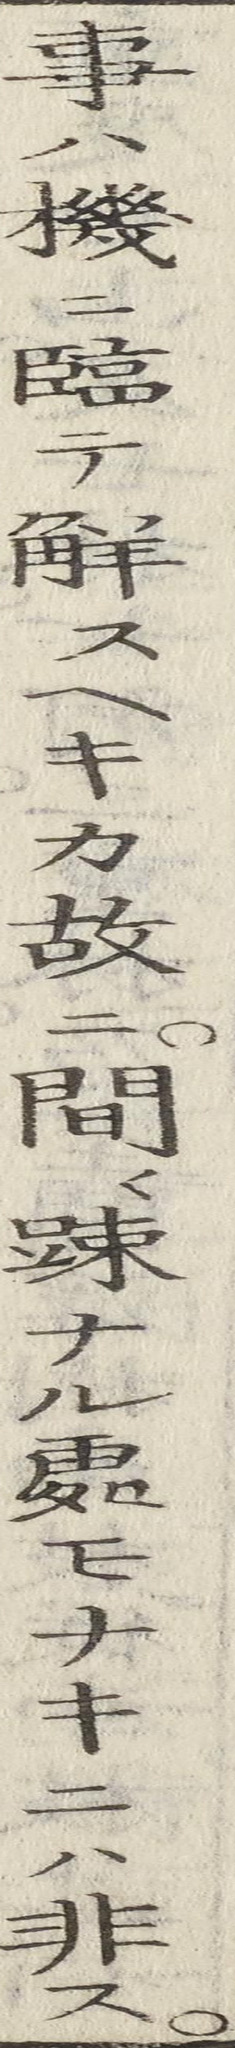事ハ機ニ臨テ觧スヘキカ故ニ。間〱疎ナル処モナキニハ非ス。
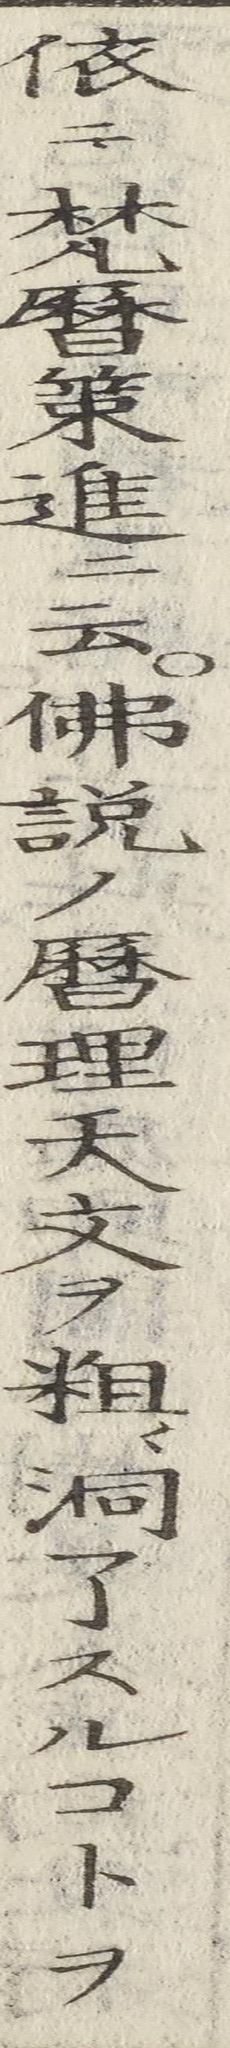依ニ梵暦策進ニ云。仏説ノ暦理天文ヲ粗〱洞了スルコトヲ
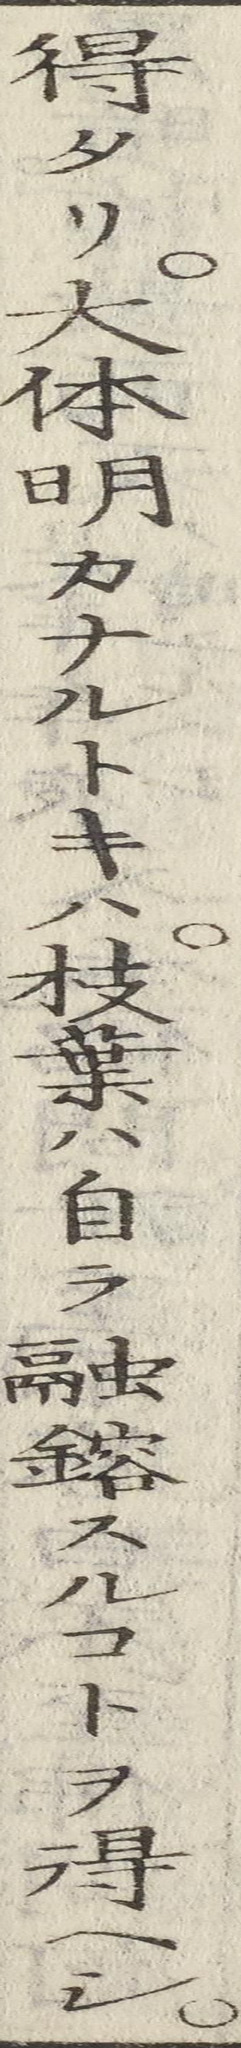得タリ。大体明カナルトキハ。枝葉ハ自ラ融鎔スルコトヲ得ヘシ。
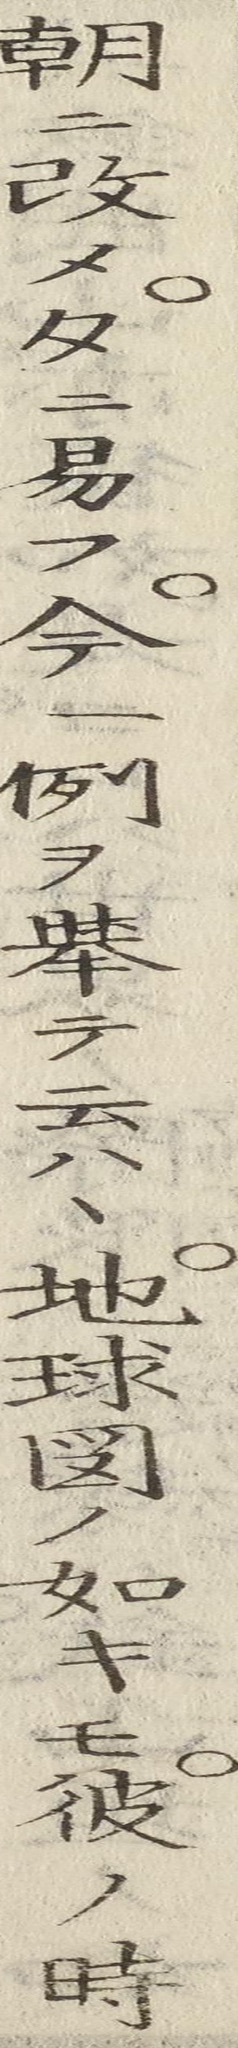朝ニ改メ。夕ニ易フ。今一例ヲ挙テ云ハヽ。地球図ノ如キモ。彼ノ時
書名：護法新論　二編　上
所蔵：東京大学地震研究所図書室 Earthquake Research Institute Library, The University of Tokyo, JAPAN
